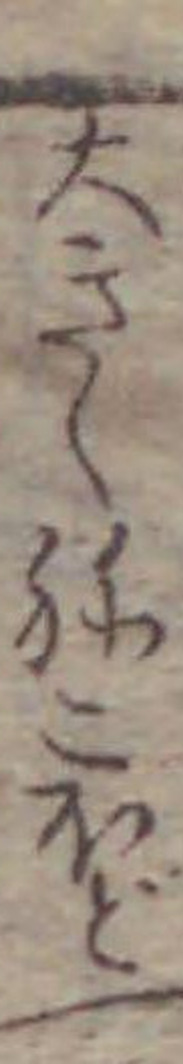大きくねこほど
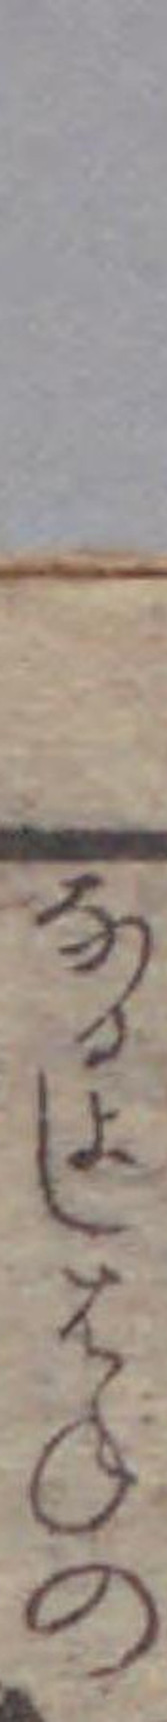あるよしはねの
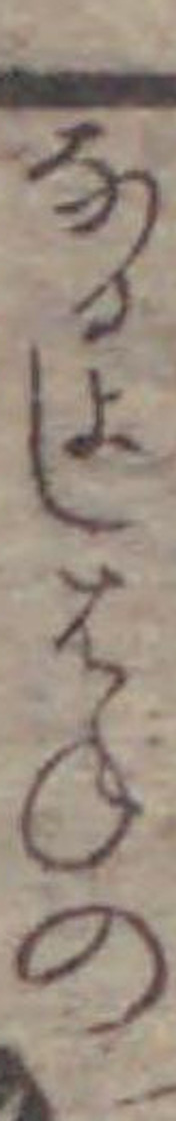あるよしはねの
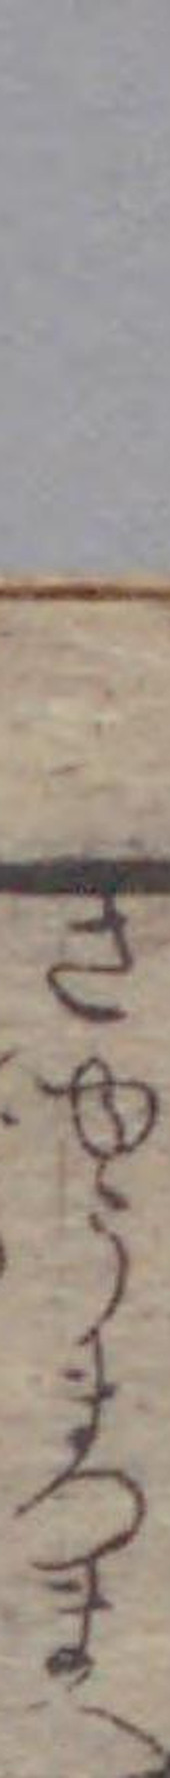さゆうまつまへ
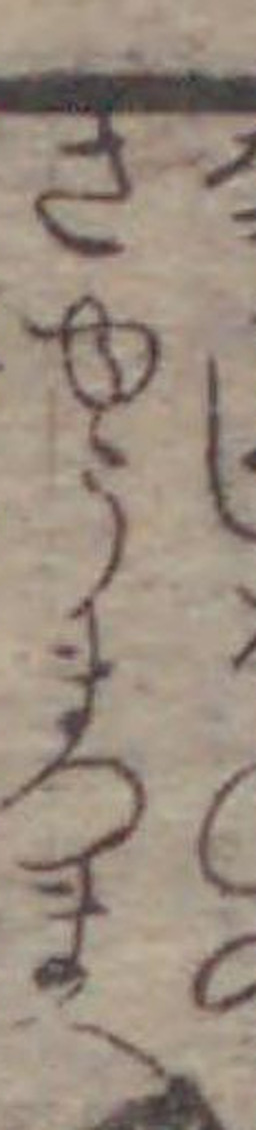さゆうまつまへ
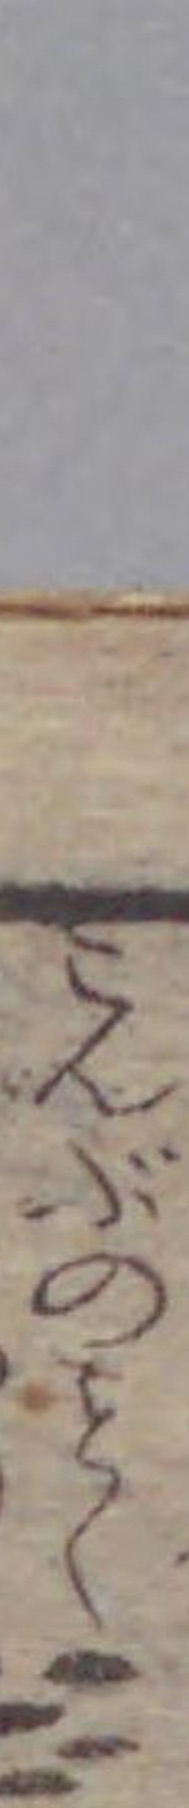こんぶのことく
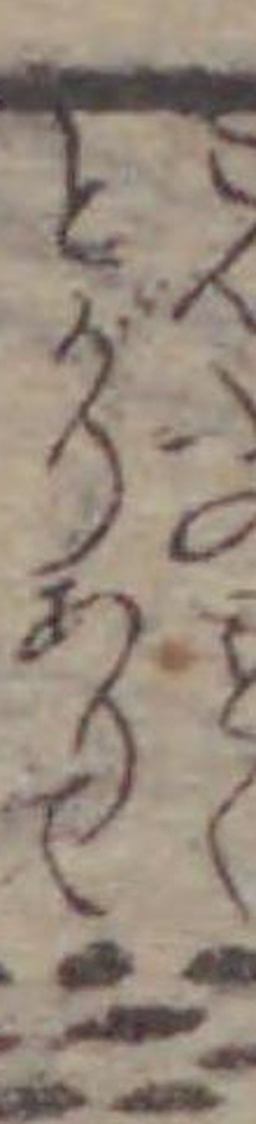とがりありて
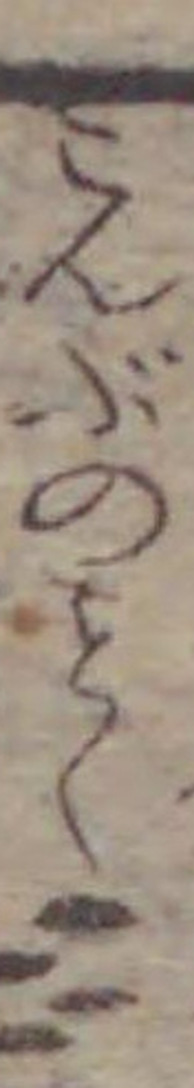こんぶのことく
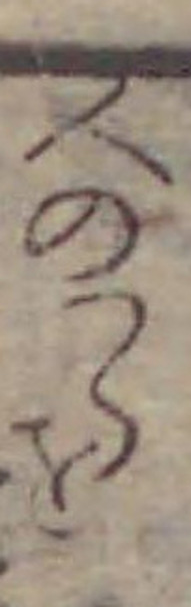人のつらを
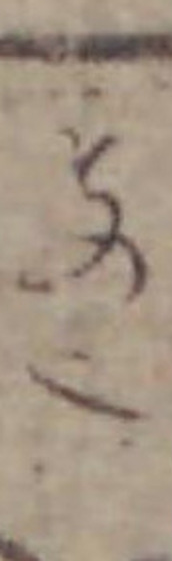もの也
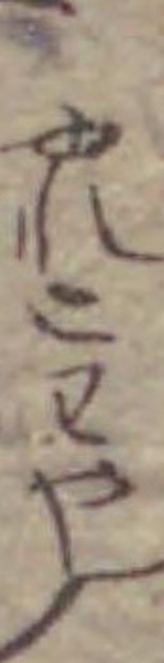やれこわや
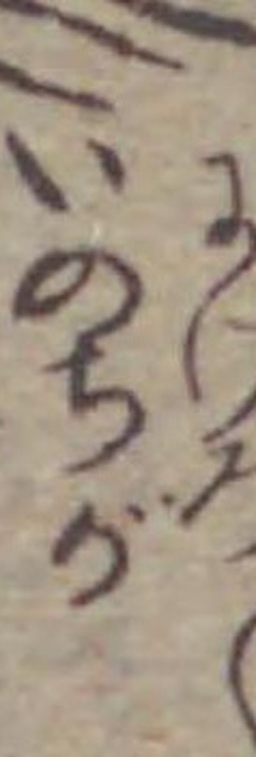いのちが
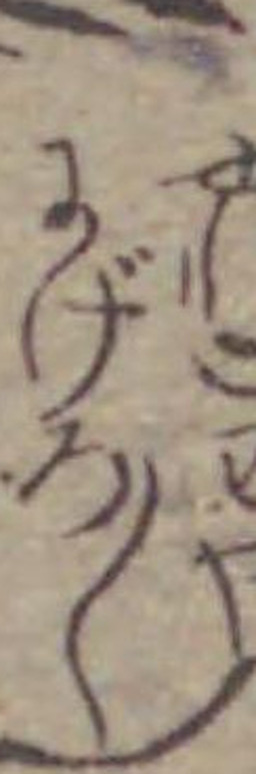にげろ〳〵
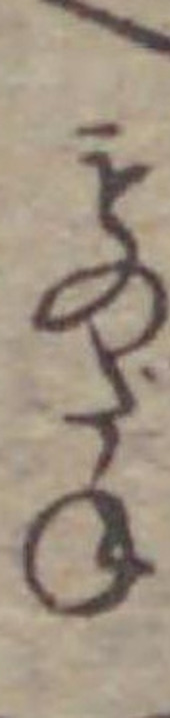ものだね
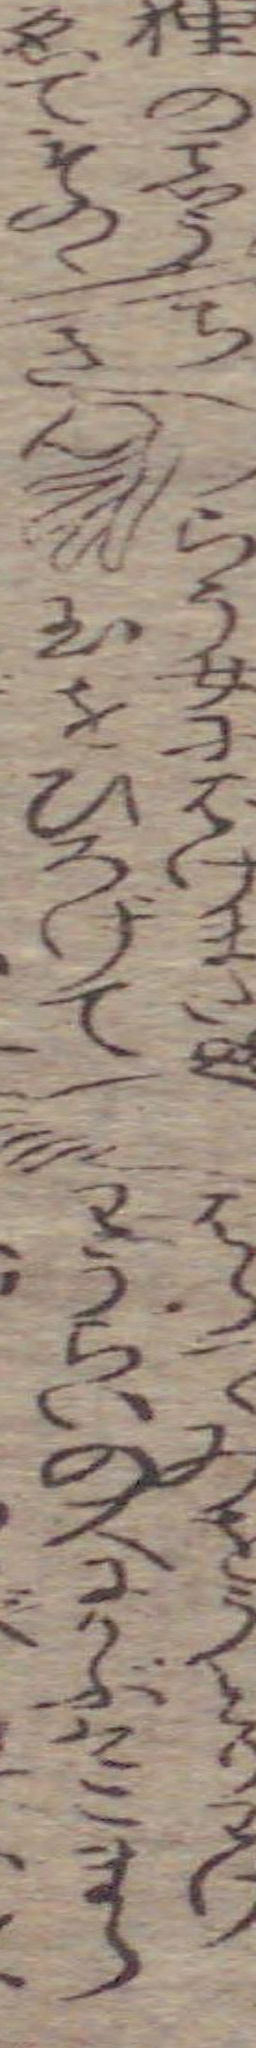ゑてものゝきん玉をひろげてわうらいの人にかぶせこまら
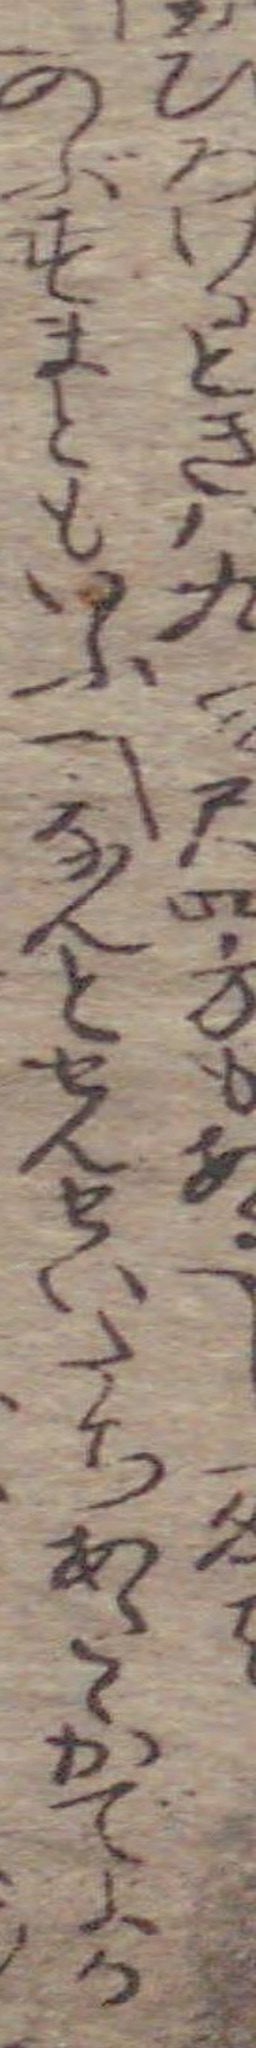のぶすまともいふ〽なんとせんせいたちあたゝかでよか
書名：妖怪仕内評判記 : 2巻
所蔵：国立国会図書館 National Diet Library, JAPAN
